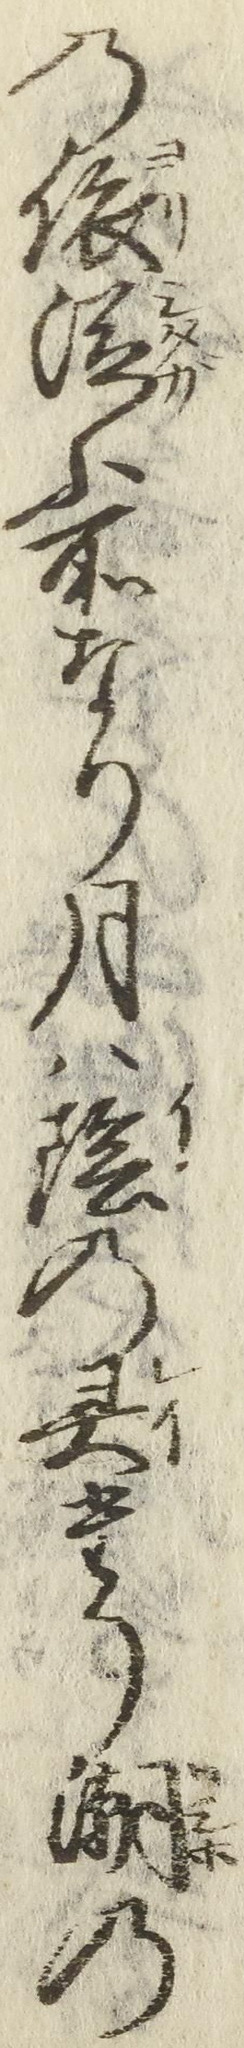の依従ふ所なり月は陰の霊たり潮の
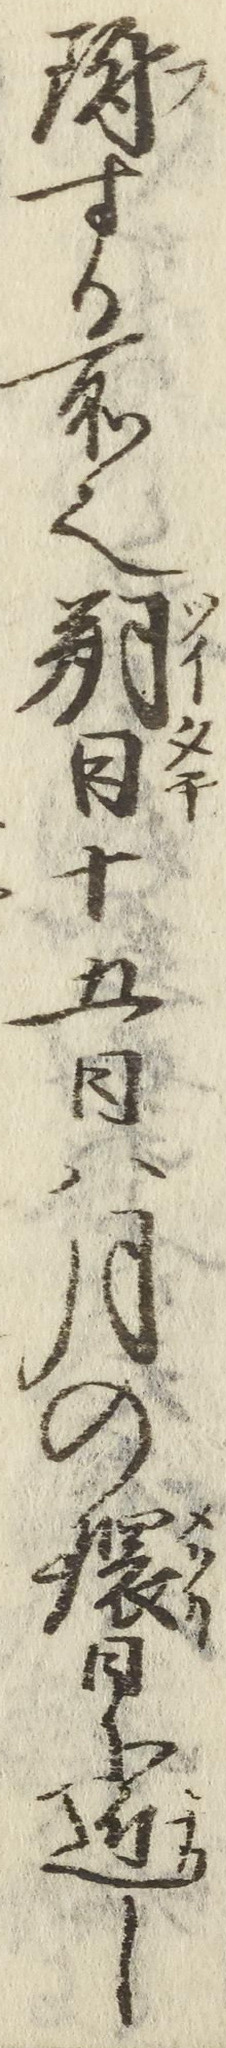附する所也朔日十五日は月の環日に近し
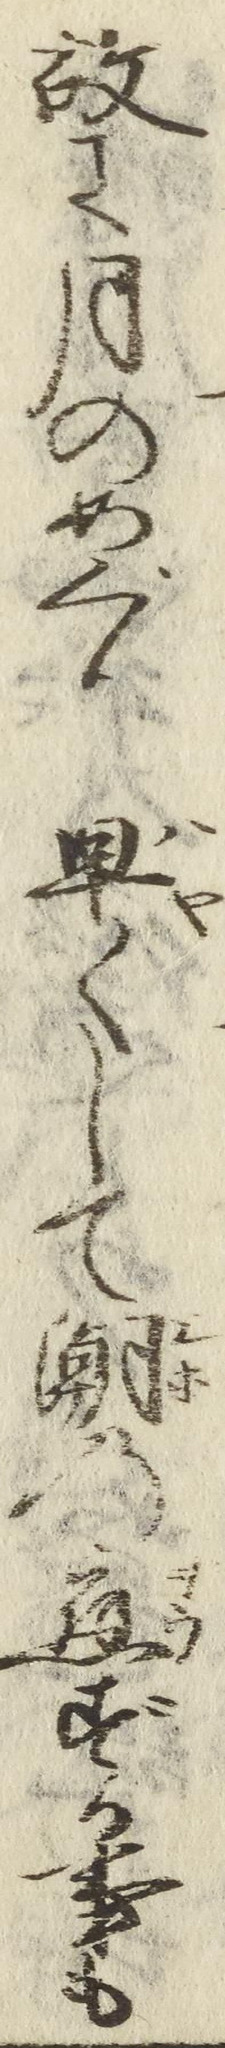故に月のめぐり早くして潮の応ずる事も
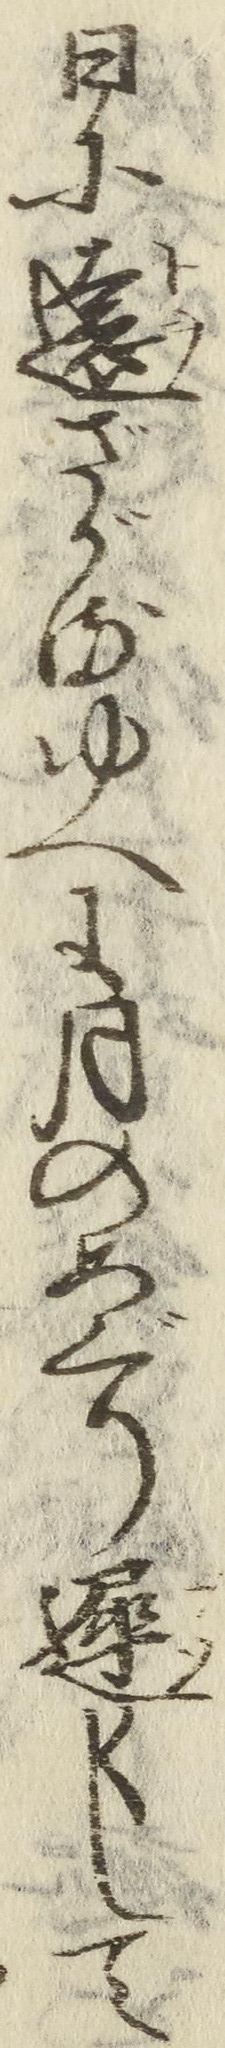日に遠ざかるゆへに月のめぐり遅くして
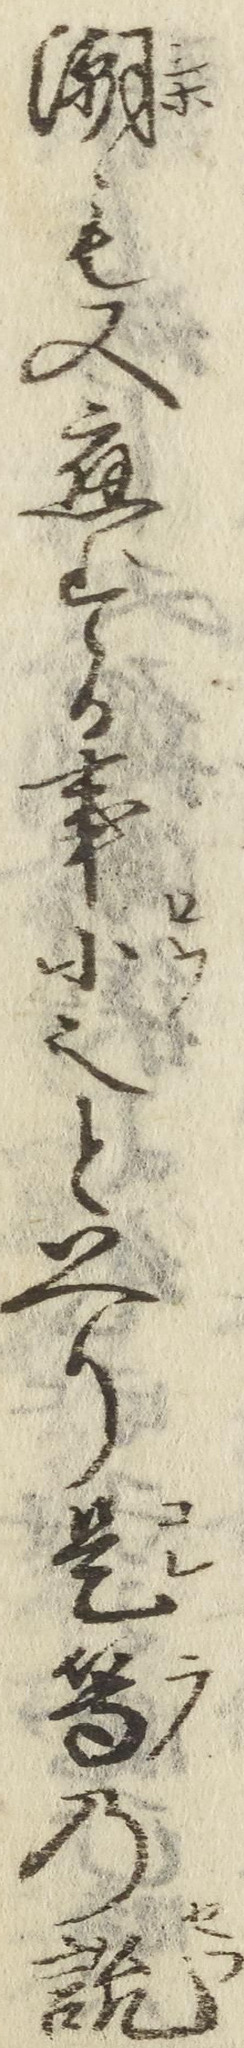潮も又応する事小也といへり是等の説

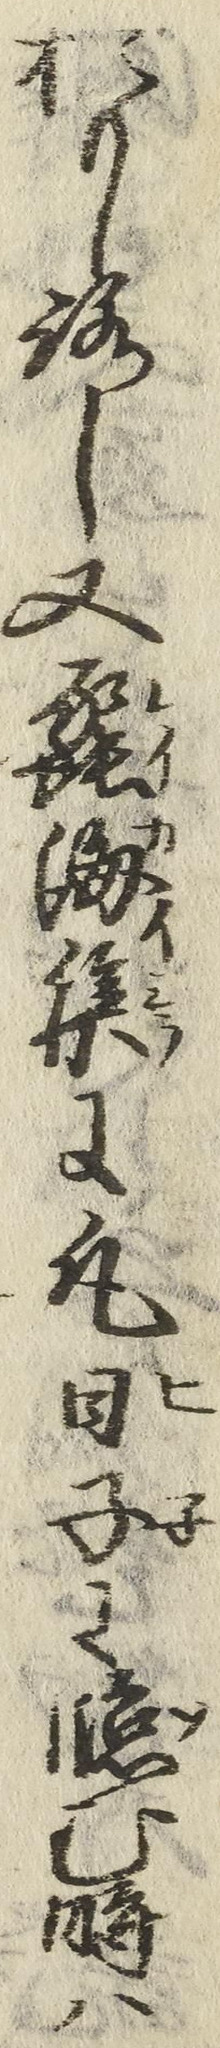おもしろし又蟸海集に凡日子に臨む時は
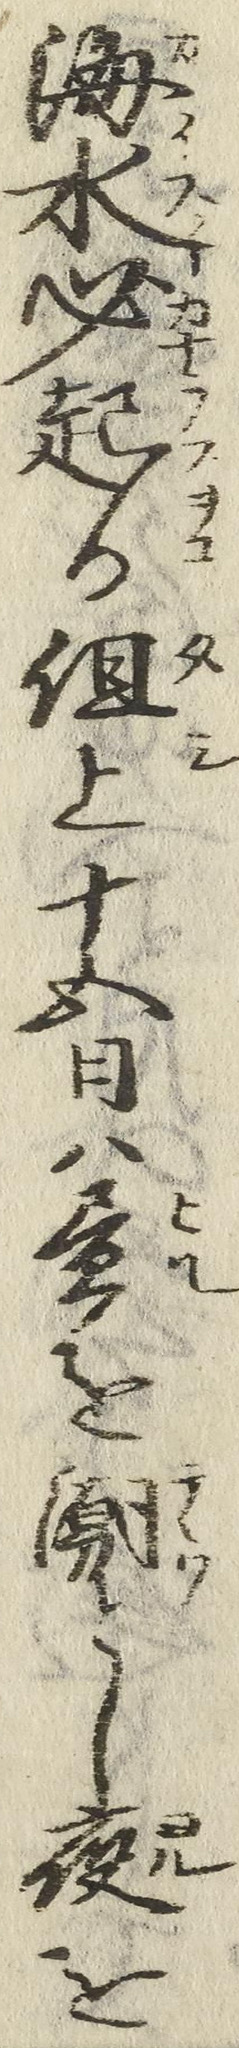海水必起る但上十五日は昼を潮とし夜を
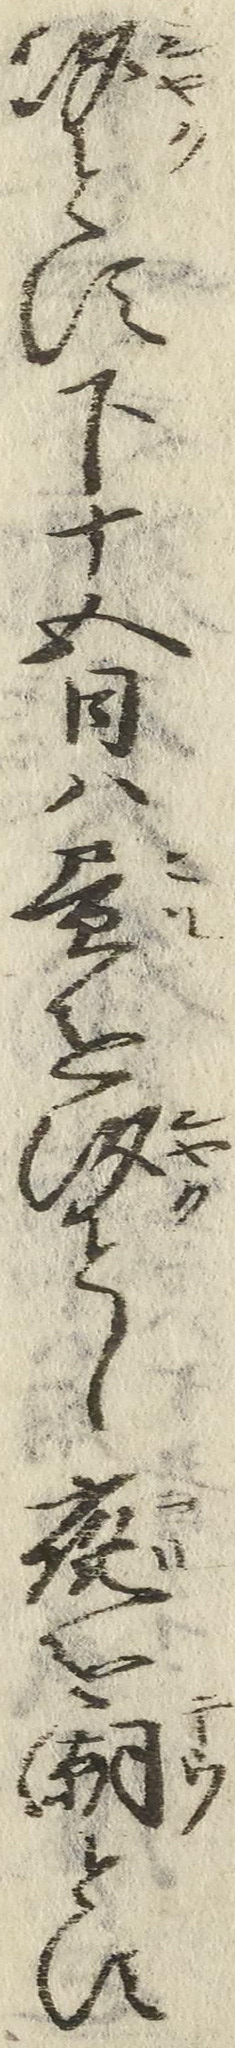汐とす下十五日は昼を汐とし夜を潮とす
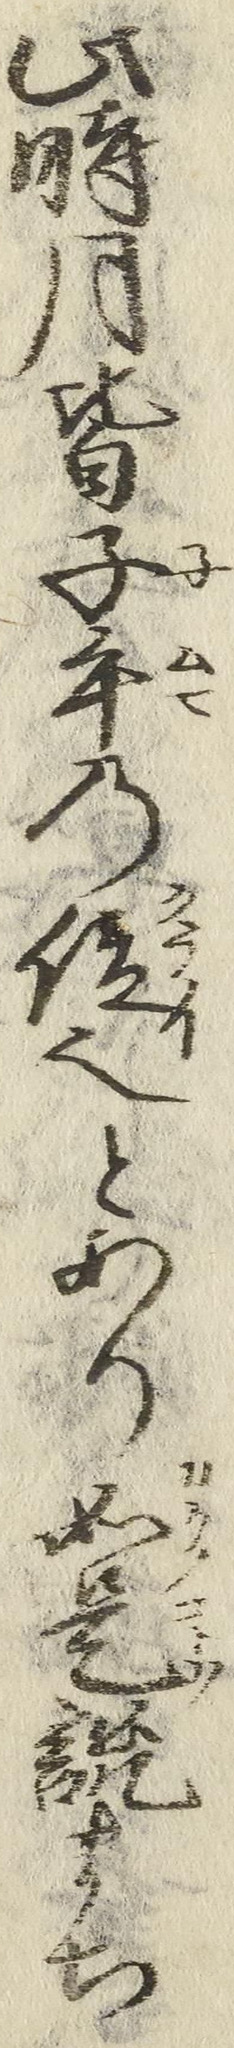此時月皆子午の位也とあり如是説まち
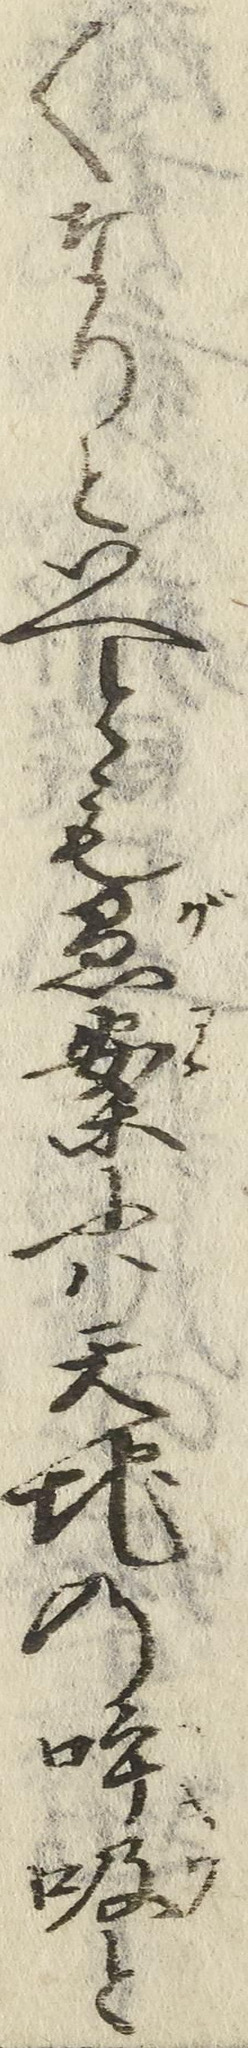〳〵なりといへとも愚案には天地の呼吸と
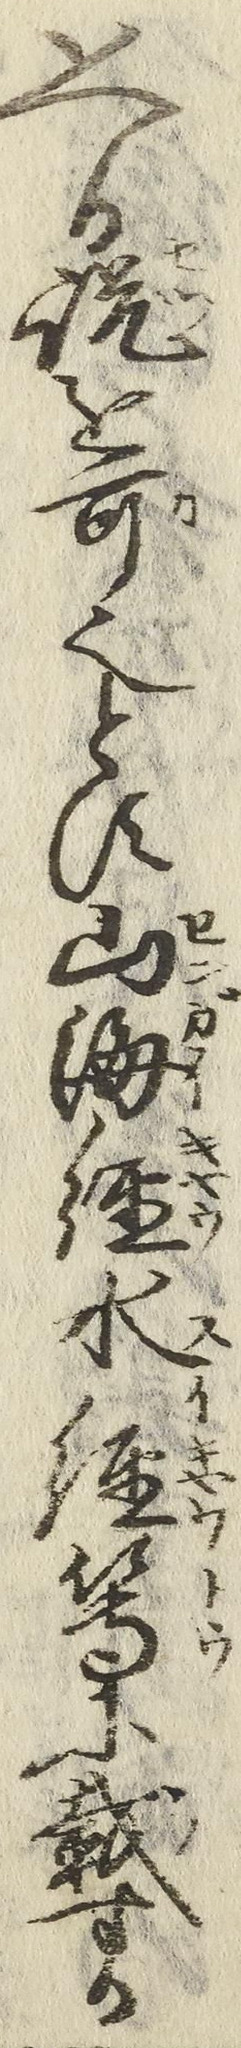いへる説を可也とす山海経水経等に載する
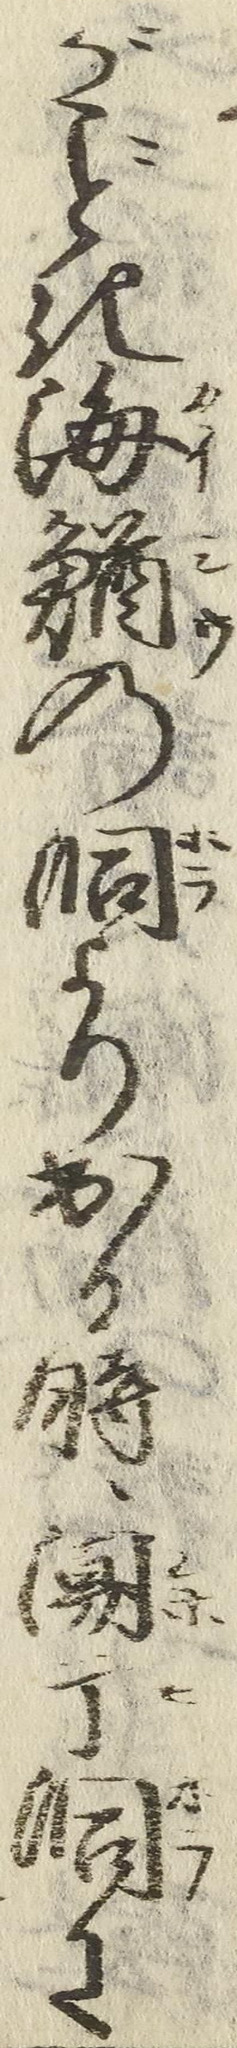がごとき海鰌の洞より出る時は潮干洞に
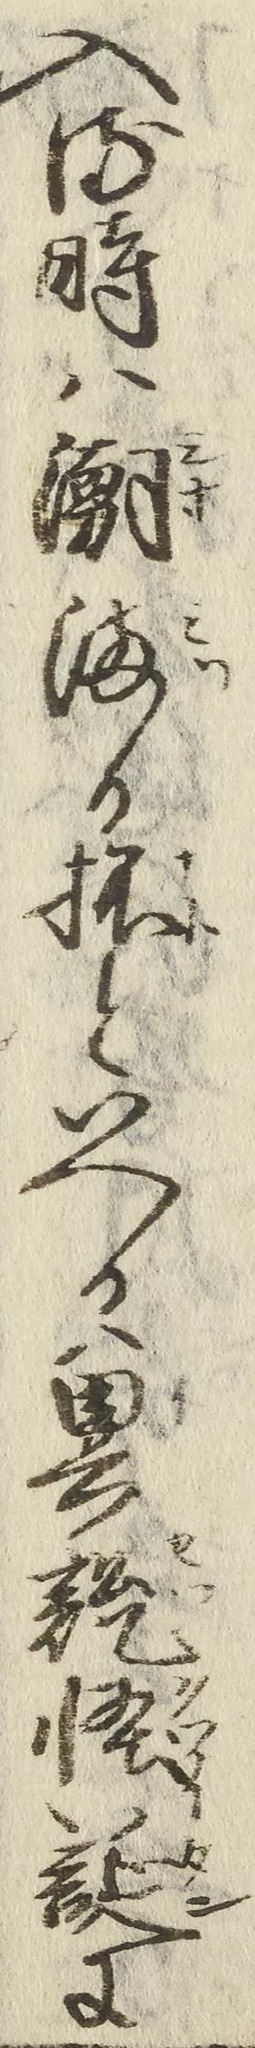入る時は潮満る抔といへるは異説怪誕に
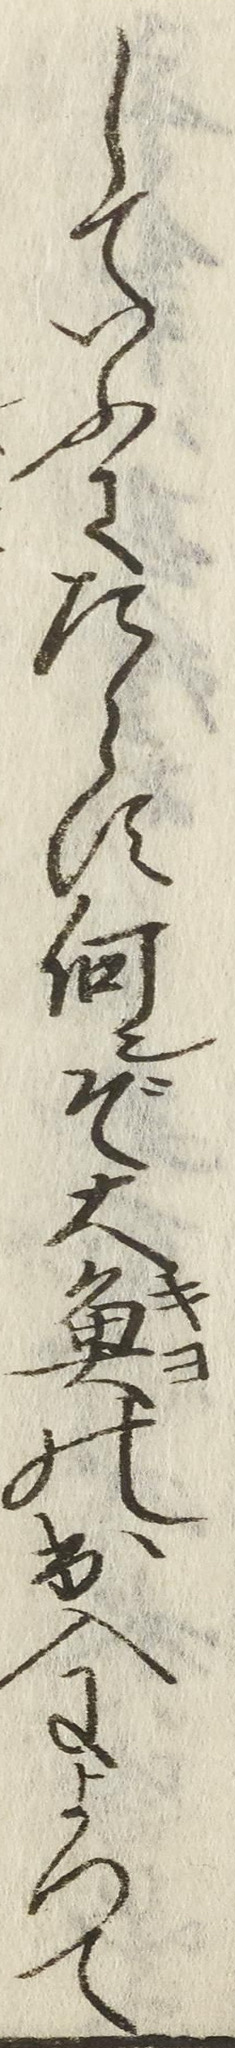していふにたらす何ンぞ大魚の出入によつて
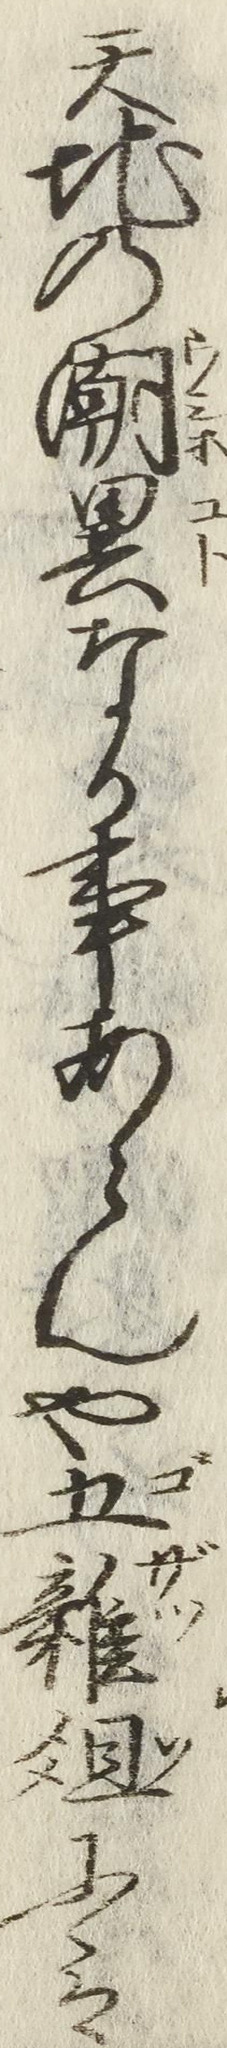天地の潮異なる事あらんや五雑俎には
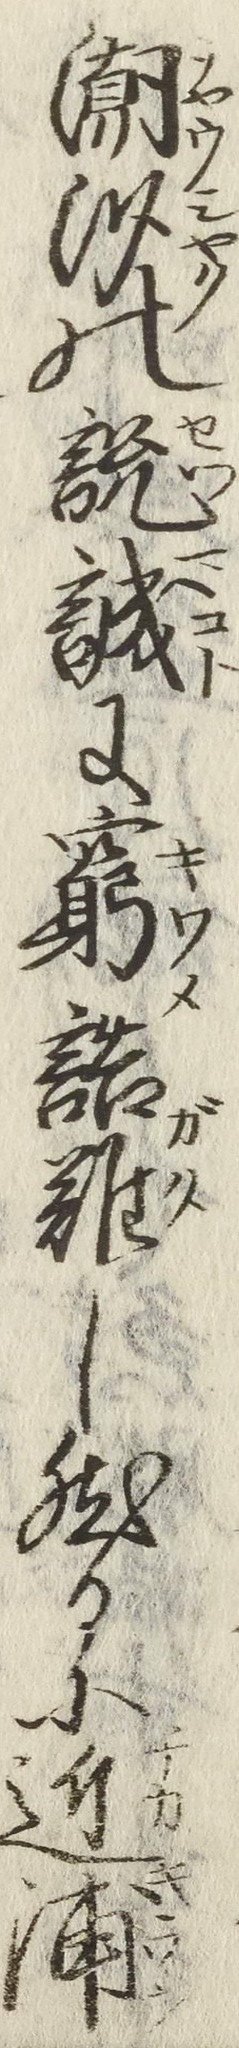潮汐の説誠に窮詰難し然るに近浦
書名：天地或問珍　天
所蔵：東京大学地震研究所図書室 Earthquake Research Institute Library, The University of Tokyo, JAPAN
